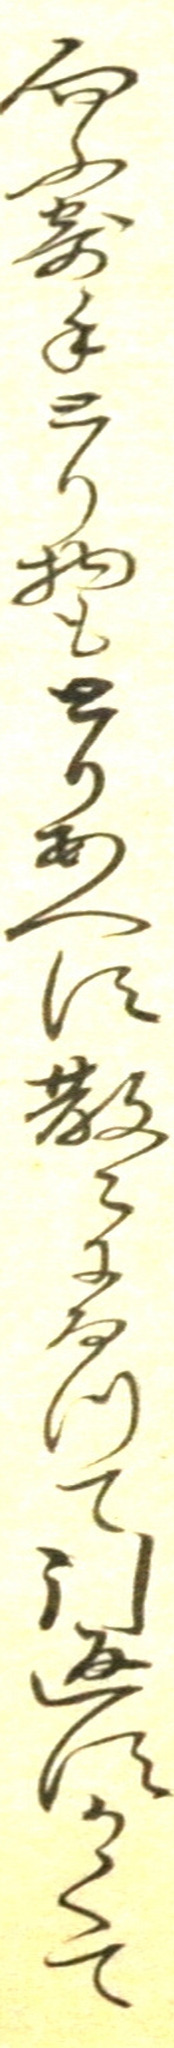向ふ寄手とり物もとりあへす散々になつて引返すかくて
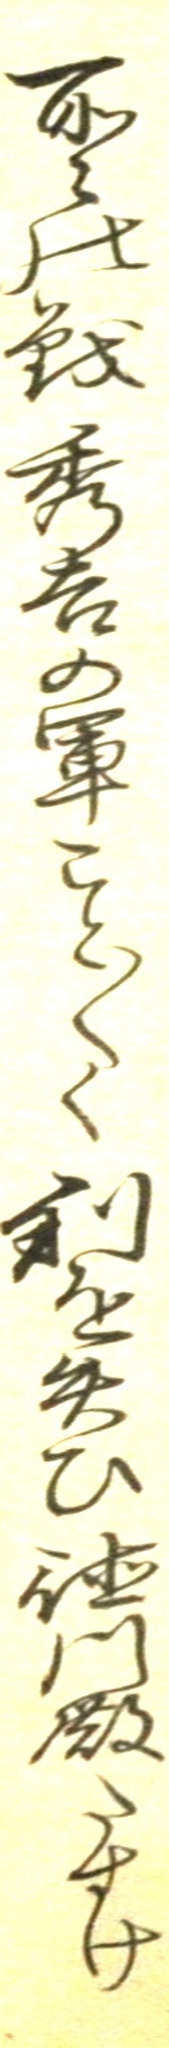所々の戦秀吉の軍こと〳〵く利を失ひ徳川殿たすけ
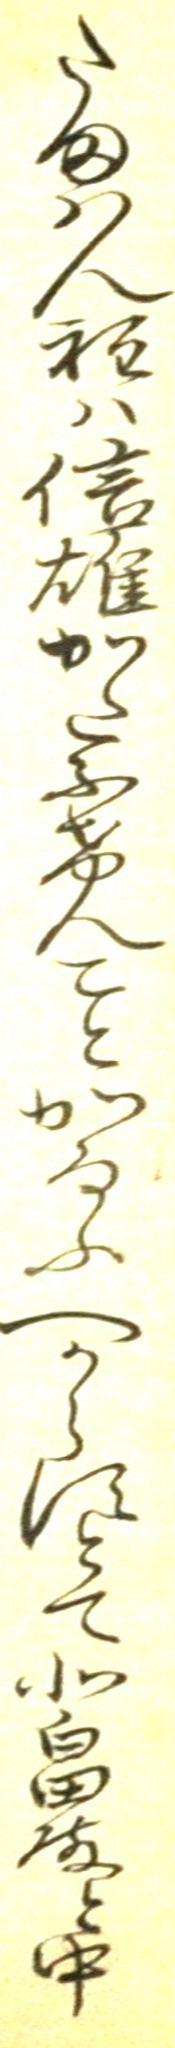たまはん程は信雄かたふけんことかなふへからすとて北畠殿と中
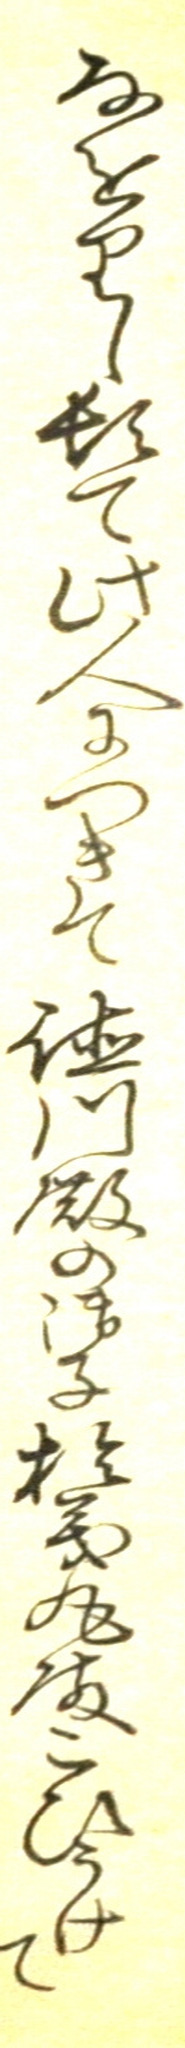なをりし頓て此人につきて徳川殿の御子於義丸殿こひうけて
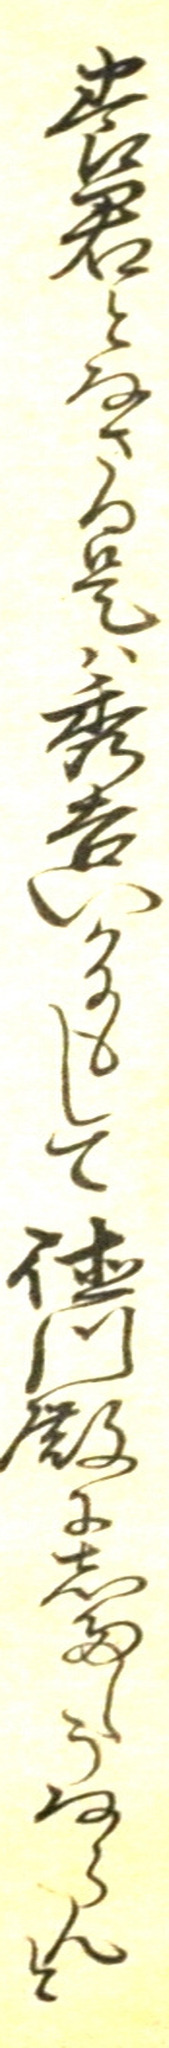養君となさる是は秀吉いかにもして徳川殿にしたしうならんと
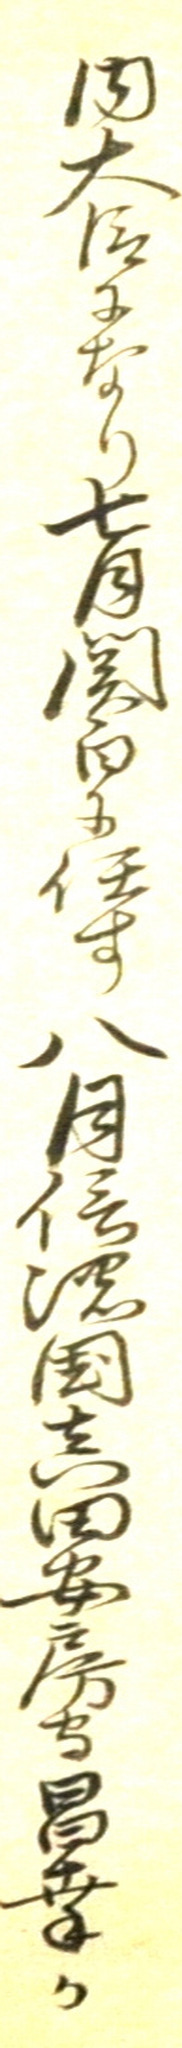内大臣になり七月関白に任す八月信濃国真田安房守昌幸か
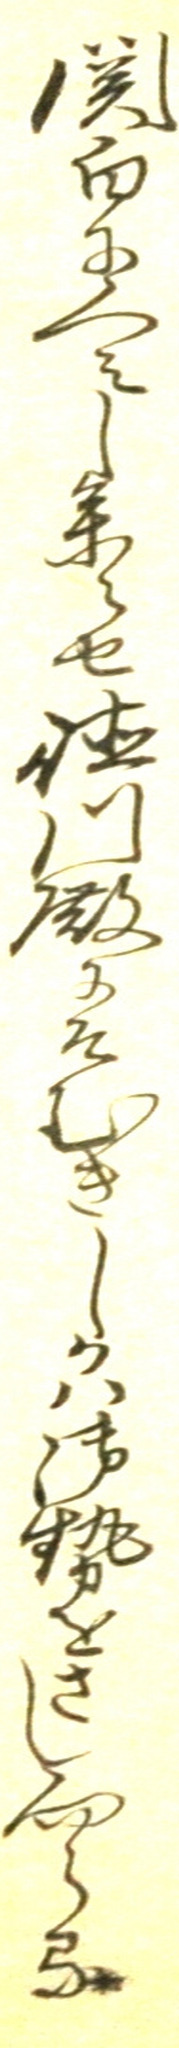関白にくみし参らせ徳川殿にそむきしかは御勢をさし向らる
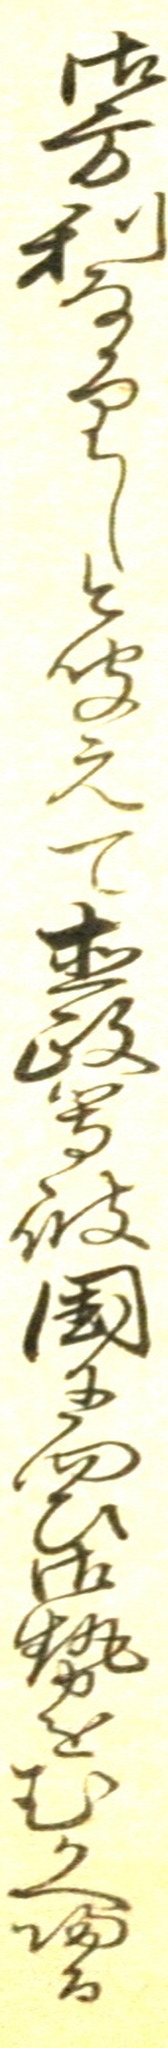御方利なかりしと聞えて直政等彼国に向ひ御勢をむかへ帰る
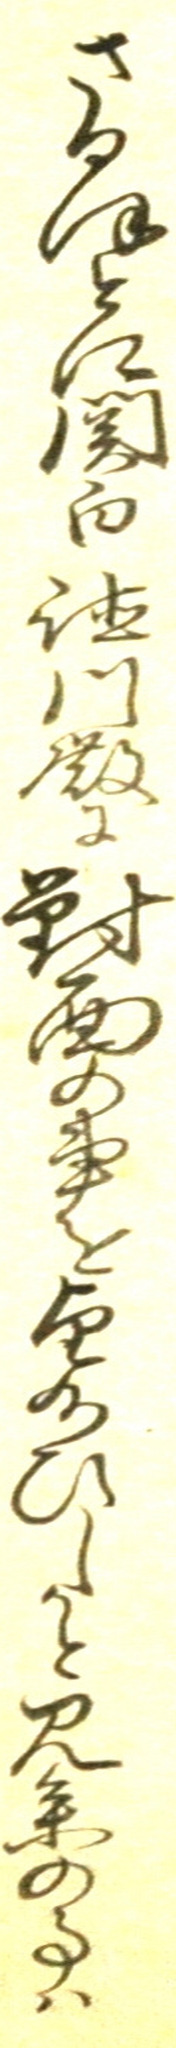さるほとに関白徳川殿に対面の事を望給ひしかと見参の事は
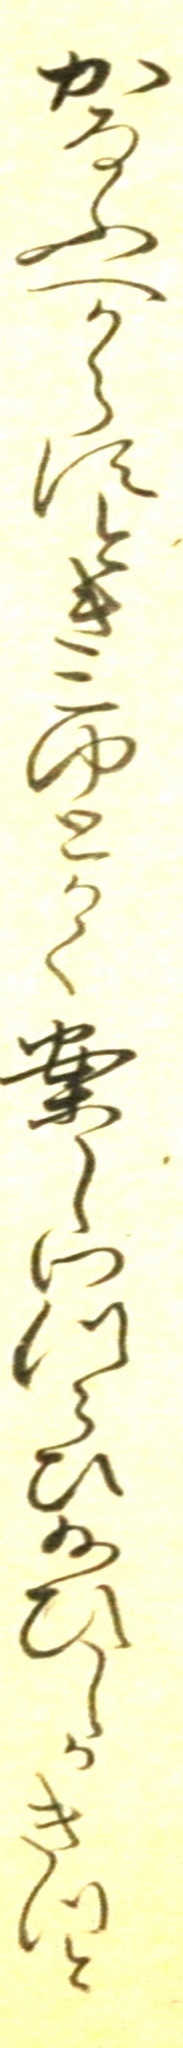かなふへからすときこゆとかく案しわつらひ給ひしかきつと
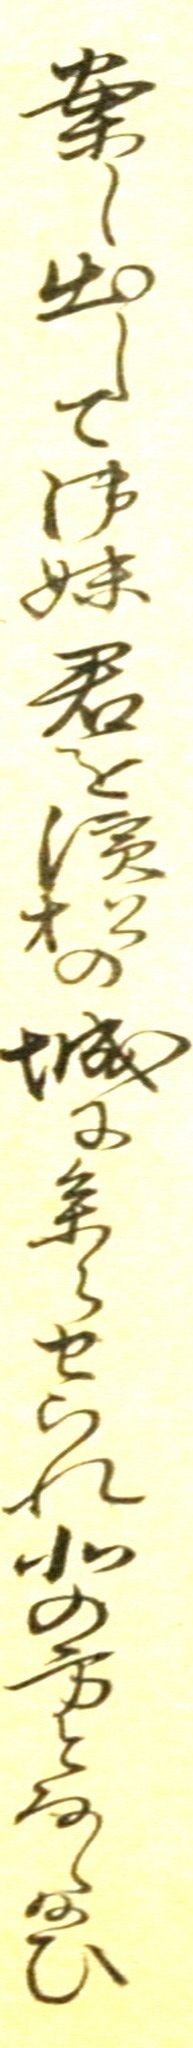案し出して御妹君を浜松の城に参らせられ北の方となし給ひ

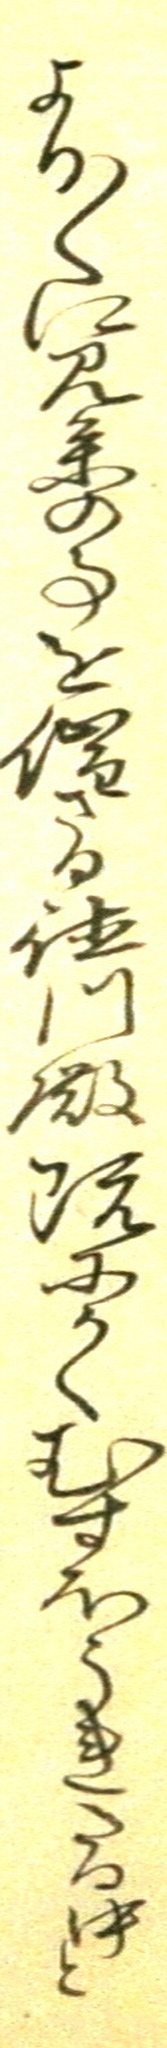より〳〵に見参の事を催さる徳川殿既にかくむすほうれたる中と
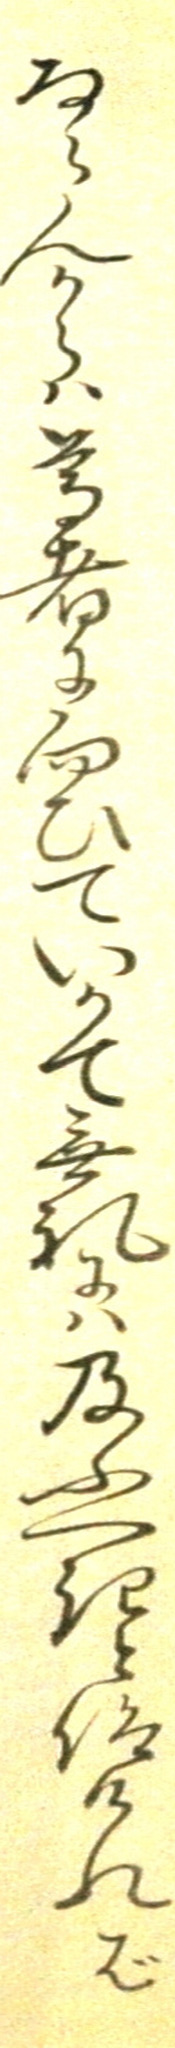ならんからは尊者に向ひていかて無礼には及ふへきと仰ければ
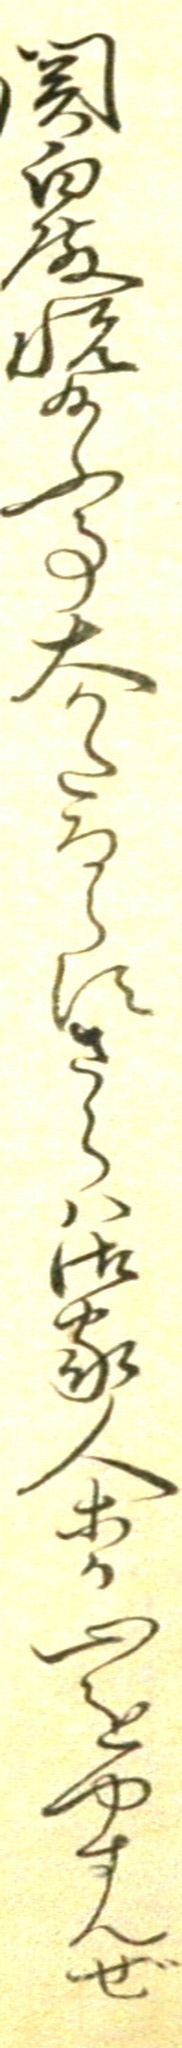関白殿悦給ふ事大かたならすさらは御家人等か心をやすんぜ
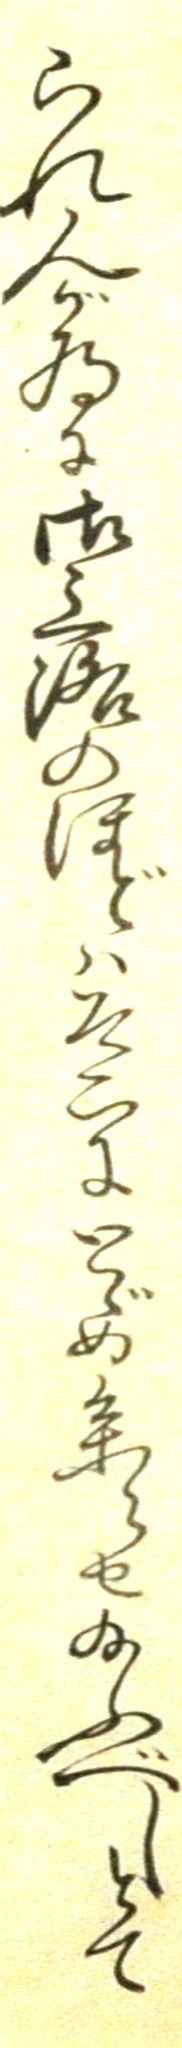られんが為に御上洛のほどはそこにとゞめ参らせ給ふべしとて
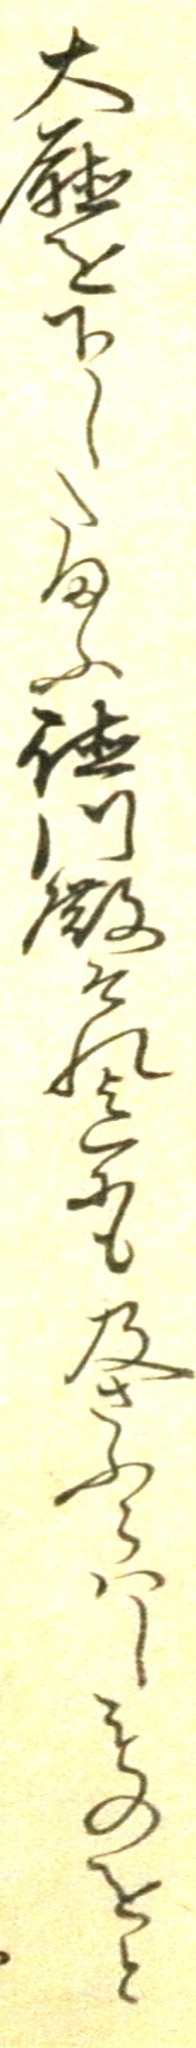大庁を下したまふ徳川殿それ迄にも及さふらはしものをと
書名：藩翰譜（四・上）
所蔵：伊那市立高遠町図書館・合同会社AMANE
